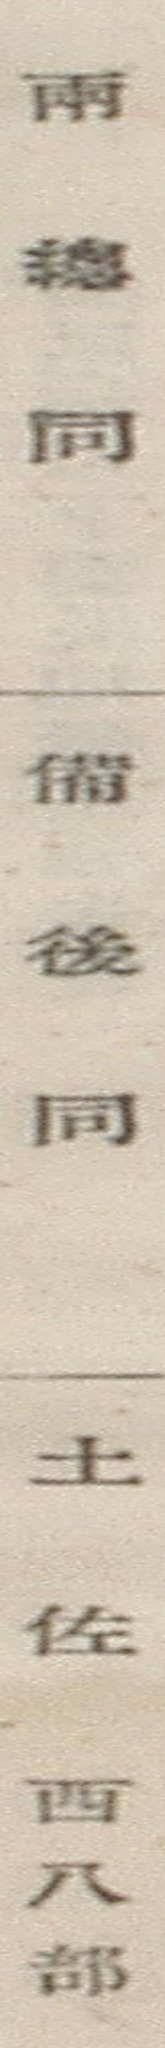両総同備後同土佐西八部
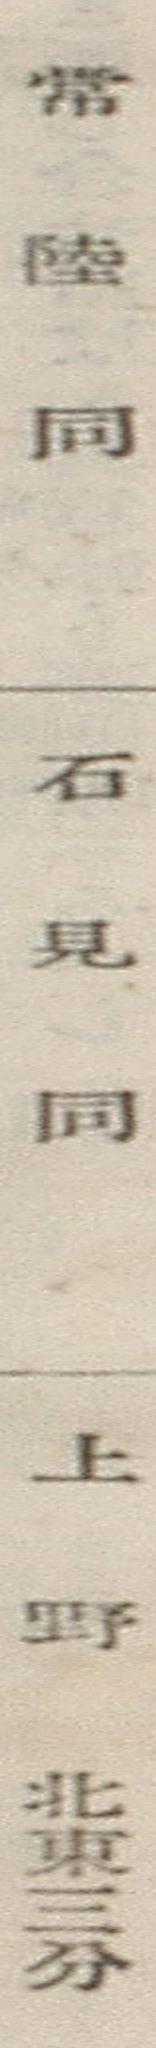常陸同石見同上野北東三分
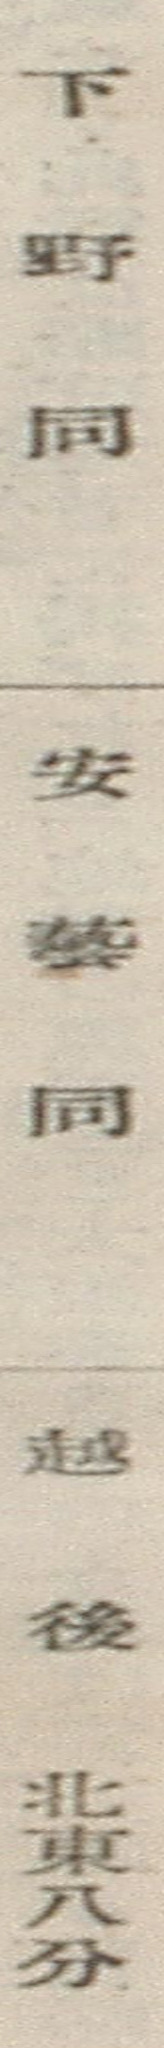下野同安芸同越後北東八分
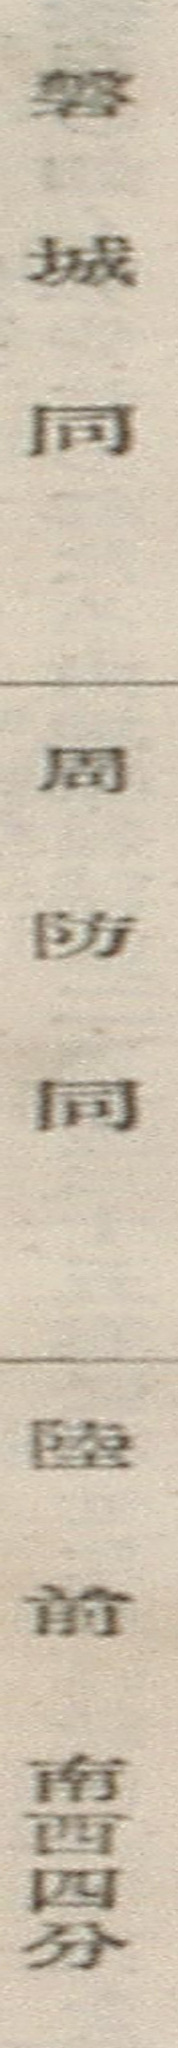磐城同周防同陸前南西四分
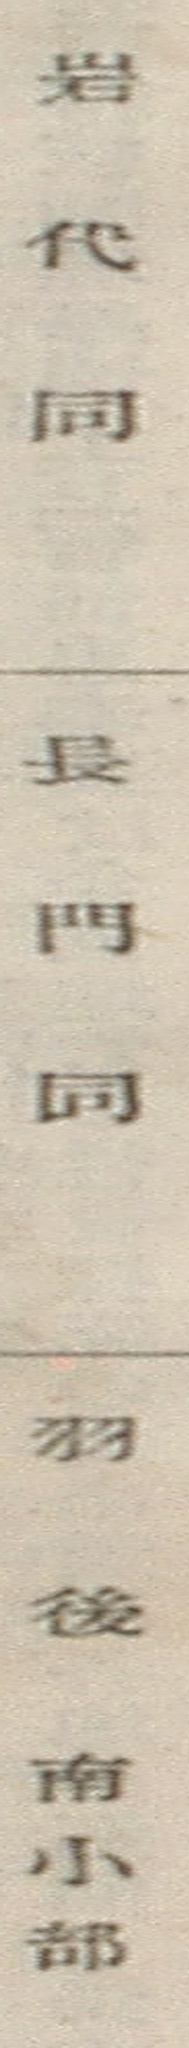岩代同長門同羽後南小部
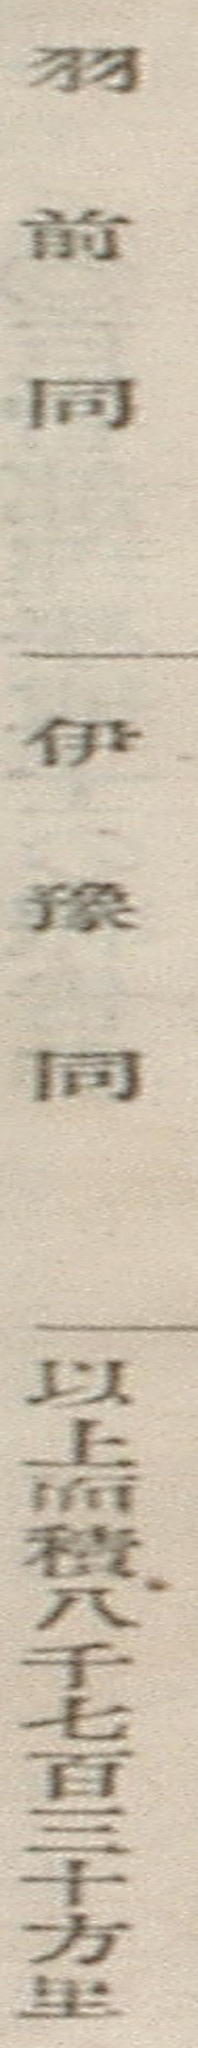羽前同伊予同以上面積八千七百三十方里

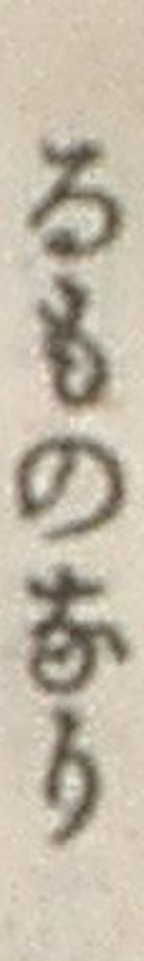るものなり
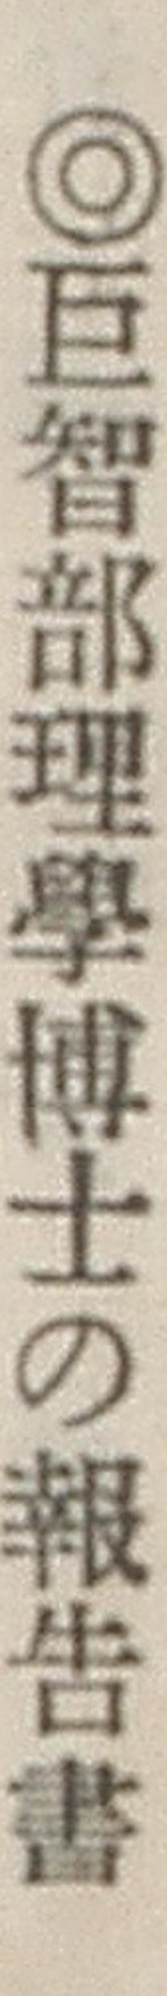◎巨智部理学博士の報告書
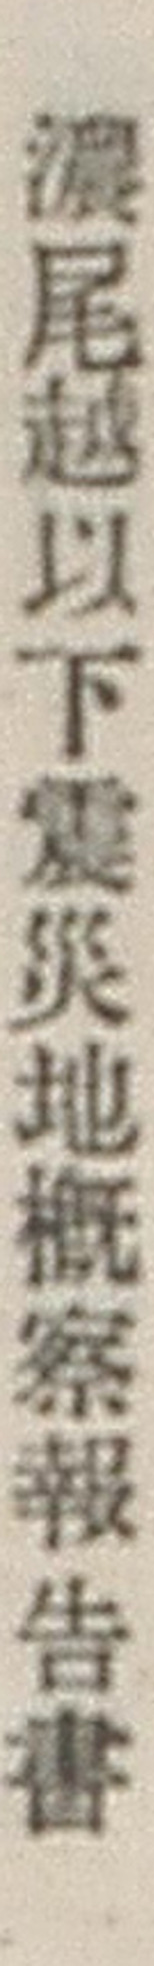濃尾越以下震災概察報告書

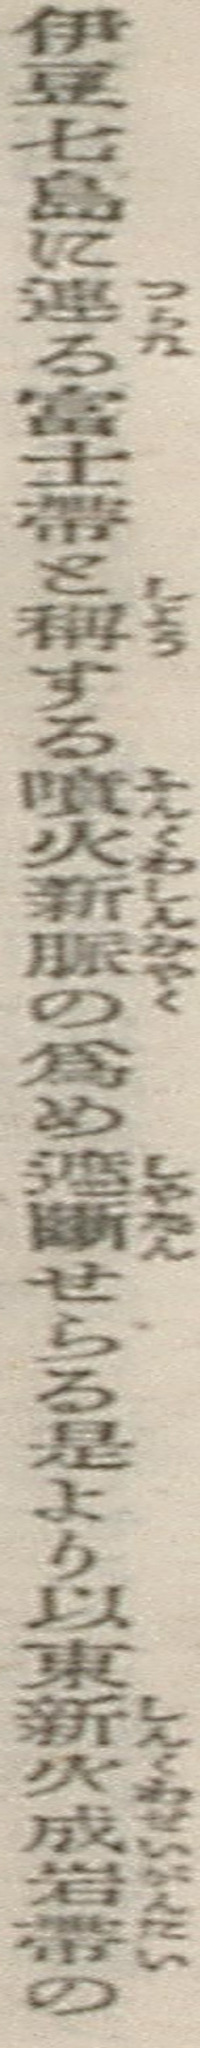伊豆七島に連る富士帯と称する噴火新脈の為め遮断せらる是より以東新火成岩帯の
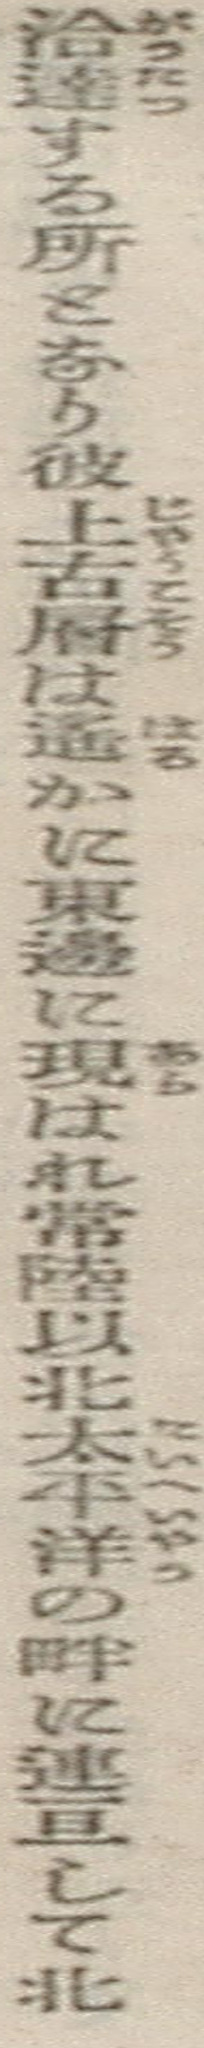洽達する所となり彼上古層は遥かに東辺に現はれ常陸以北太平洋の畔に連亘して北
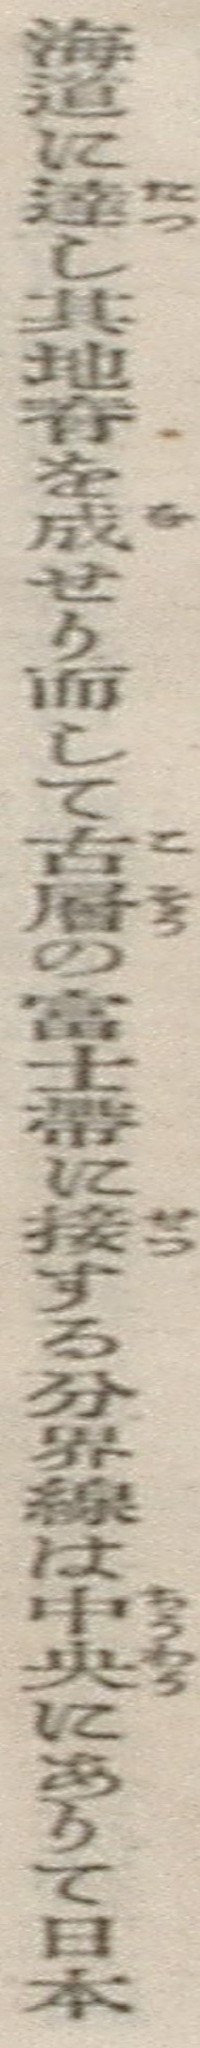海道に達し其地背を成せり而して古層の富士帯に接する分界線は中央にありて日本
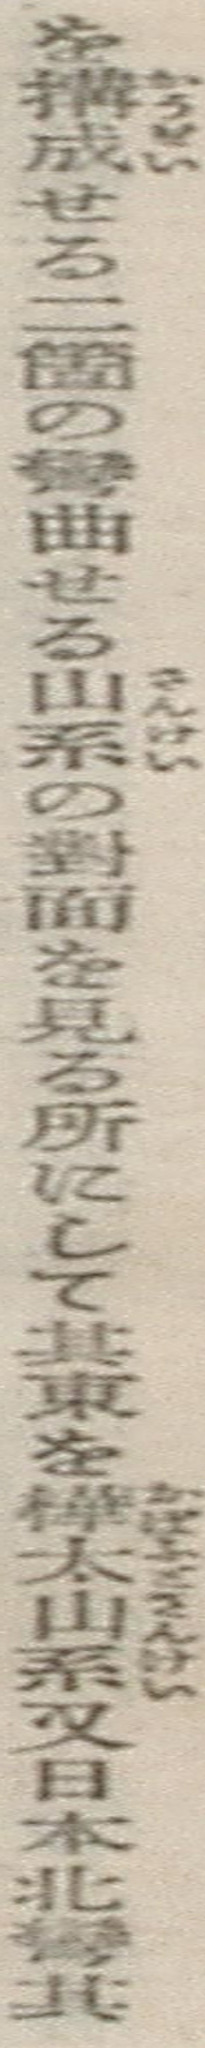を構成せる二箇の湾曲せる山系の対面を見る所にして其東を樺太山系又日本北弯其
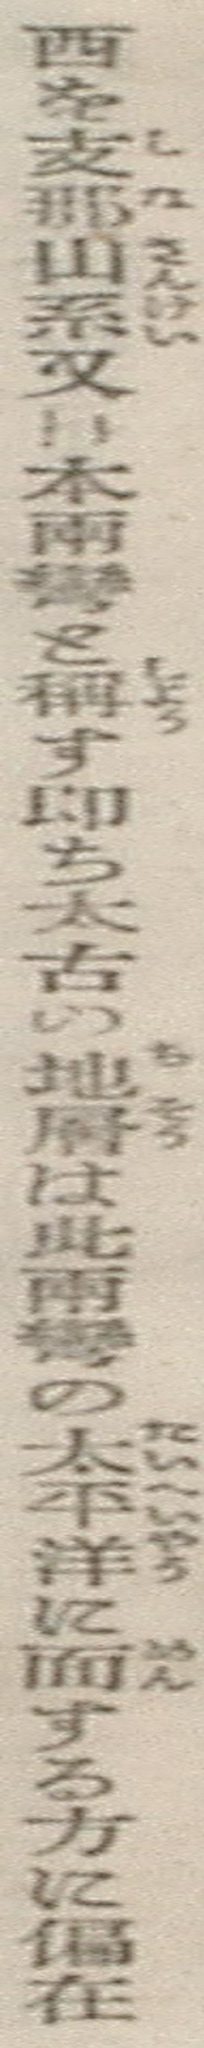西を支那山系又日本両弯と称す即ち太古の地層は此両弯の太平洋に面する方に偏在
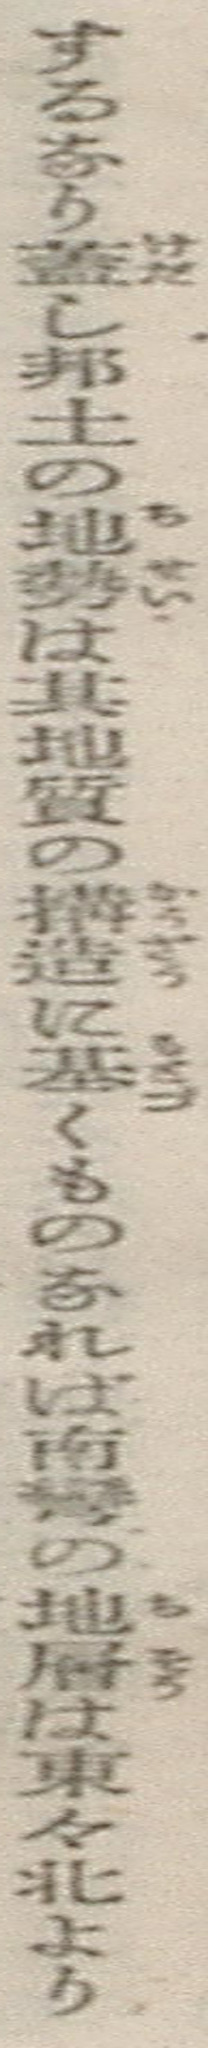するなり蓋し邦土の地勢は其地質の構造に基くものなれば南弯の地層は東々北より
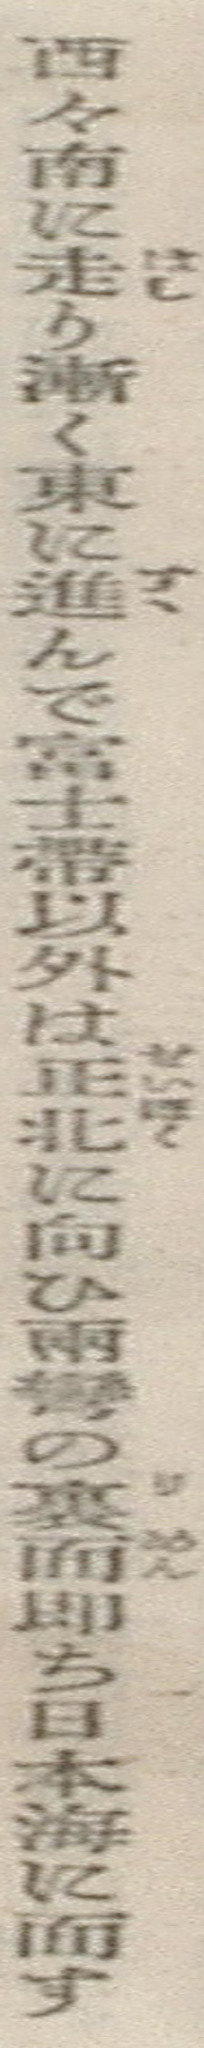西々南に走り漸く東に進んで富士帯以外は正北に向ひ両弯の裏面即ち日本海に面す
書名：愛知岐阜福井三県　大地震見聞録（内題）
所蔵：東京大学地震研究所図書室 Earthquake Research Institute Library, The University of Tokyo, JAPAN
